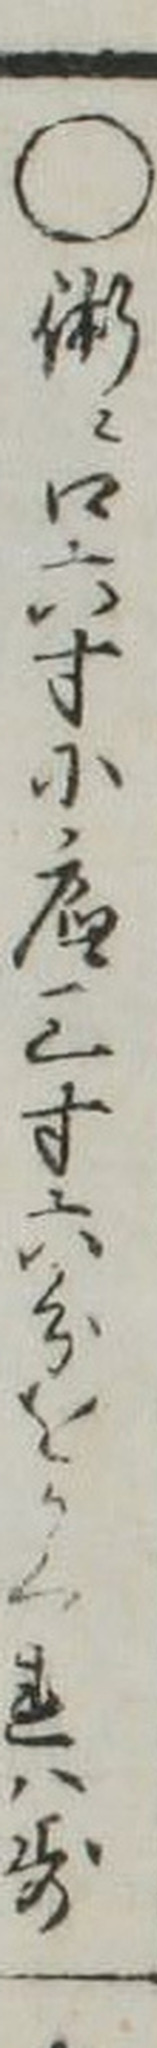○術に口六寸に底三寸六分をかくれは歩
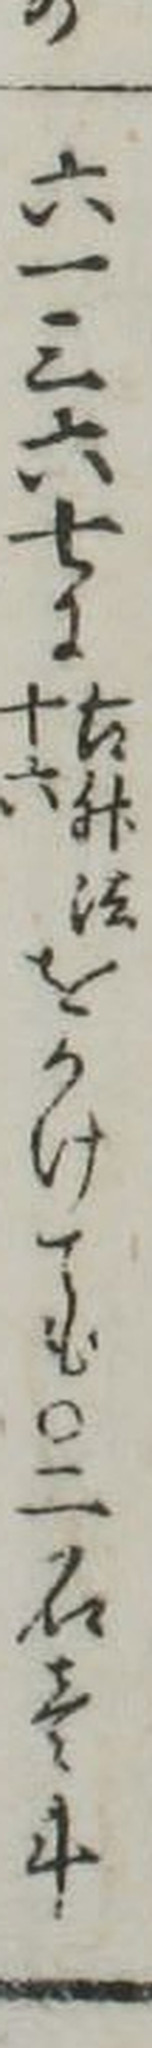六一三六七に古升法十六をかけても〇二石壱斗
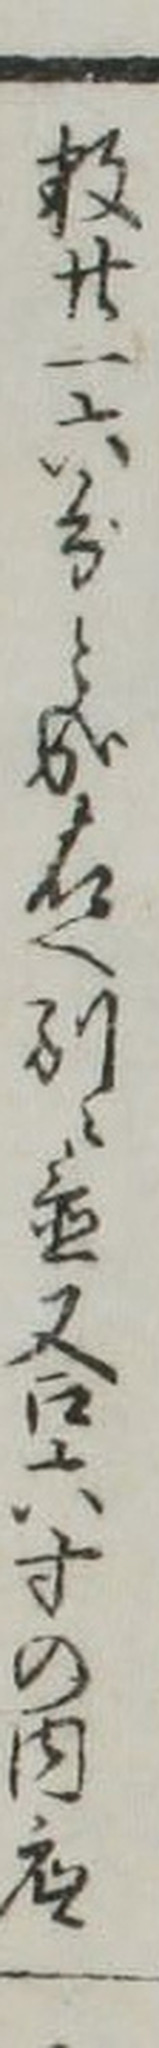数廿一六分と成右へ別に置又口六寸の内底
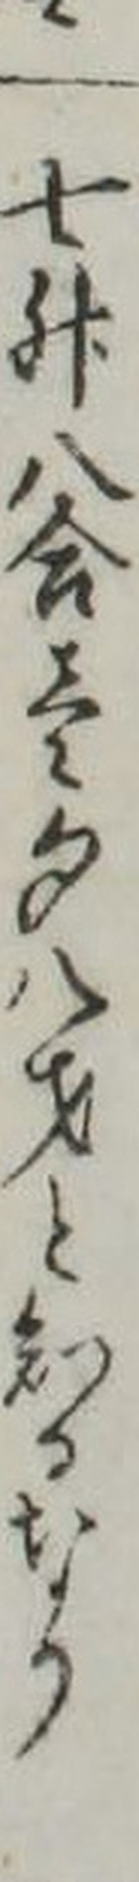七升八合壱勺八才と知るなり
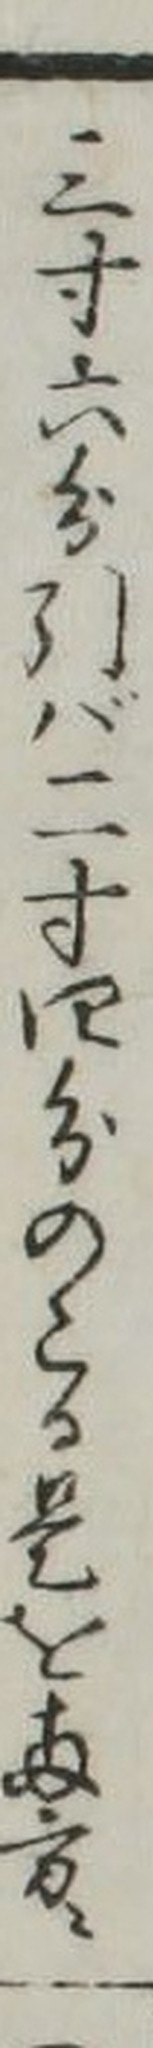三寸六分引ば二寸四分のこる是を両方に
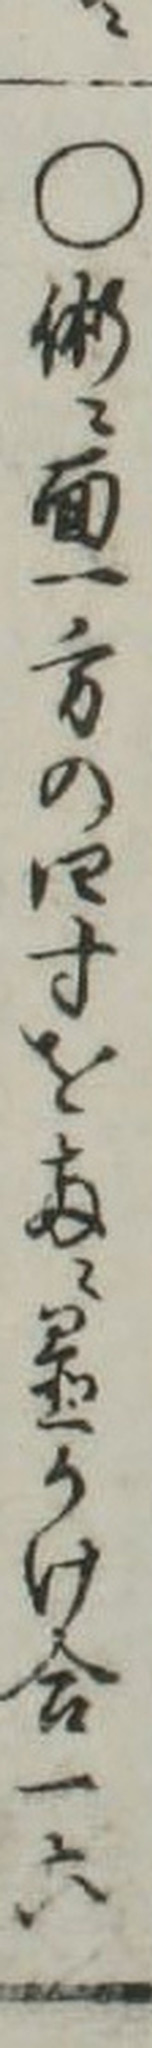○術に面一方の四方を両に置かけ合一六
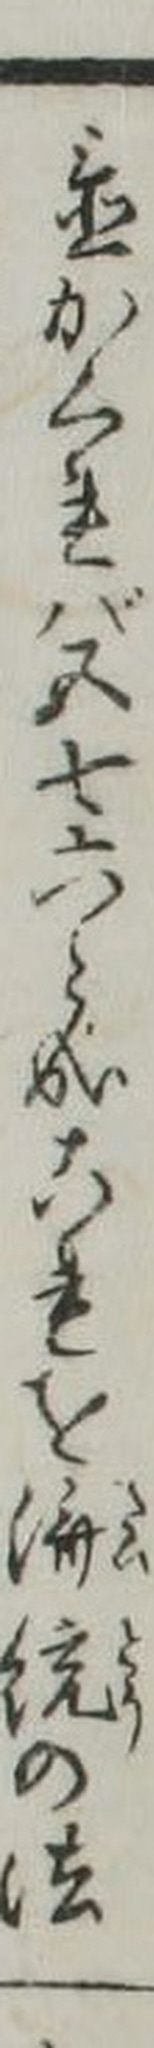置かくれば五七六と成これを済統の法
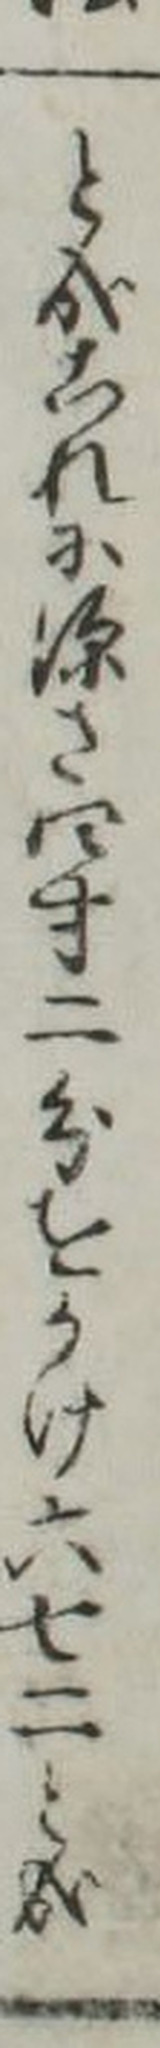と成これに深さ四寸二分をかけ六七二と成
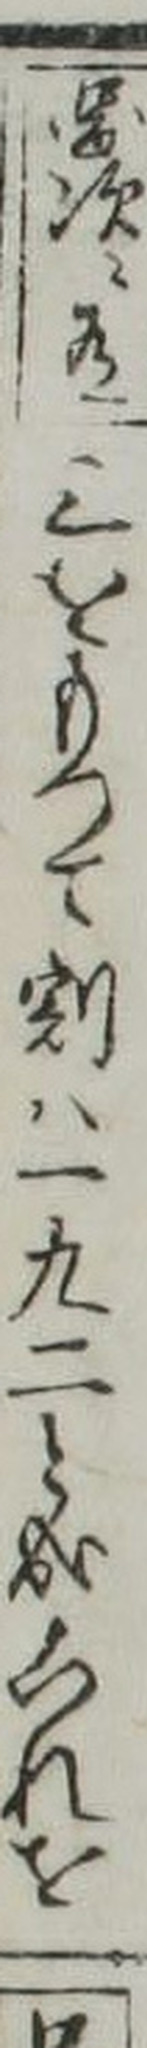[図次に有]三をもつて割は一九二と成これを
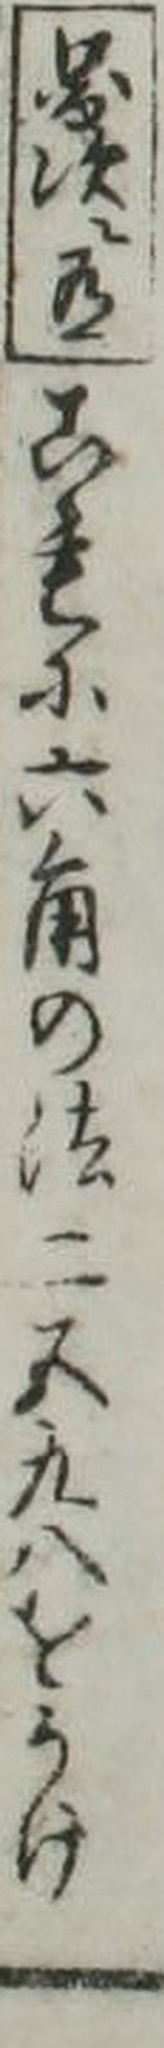[図次に有]これに六角の法二五九八をかけ

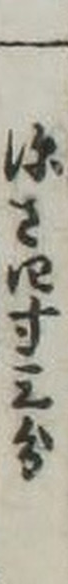深さ四寸三分
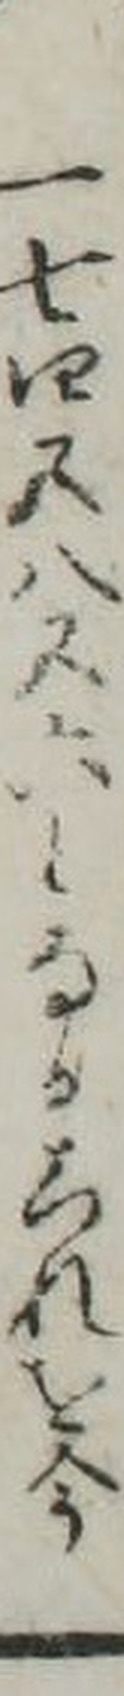同同一七四五八五六となるこれを今
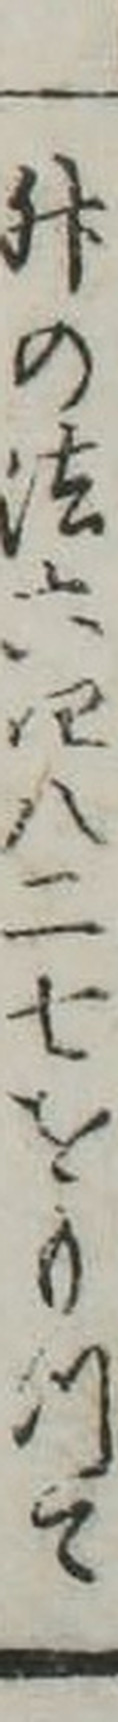寸同升の法六四八二七をもつて
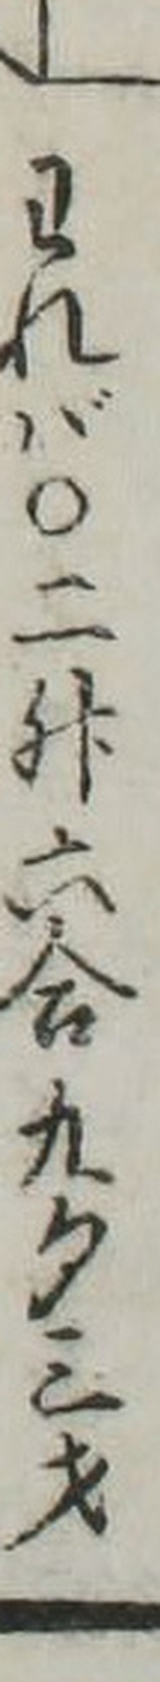四われば〇二升六合九勺三才
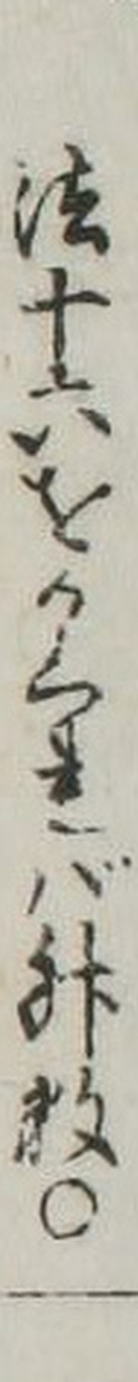六法十六をかくれば升数〇
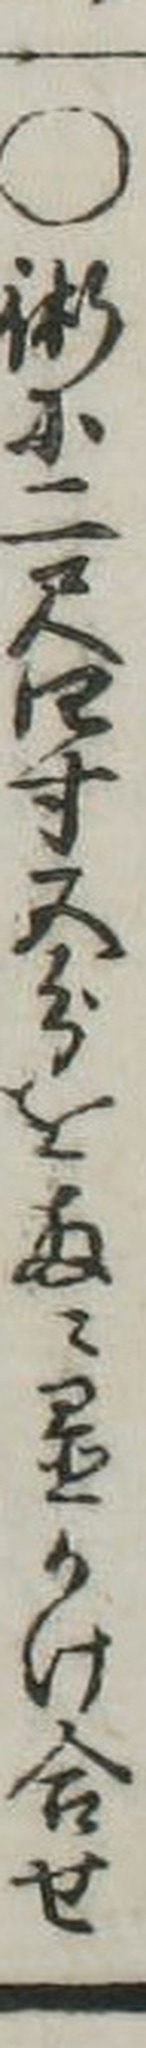○術に二尺四寸五分を両に置かけ合せ
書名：宝玉塵劫記
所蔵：東京学芸大学教育コンテンツアーカイブ
